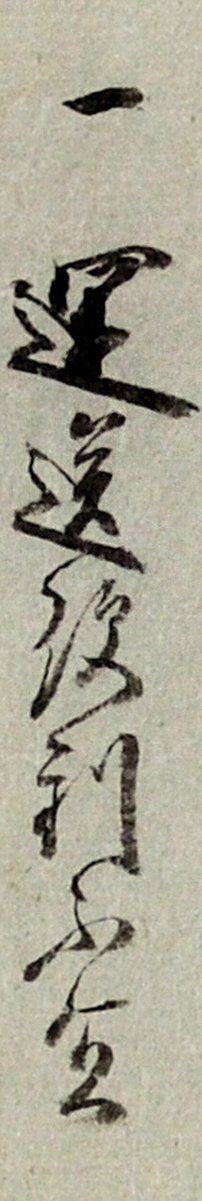一運送便利不宜
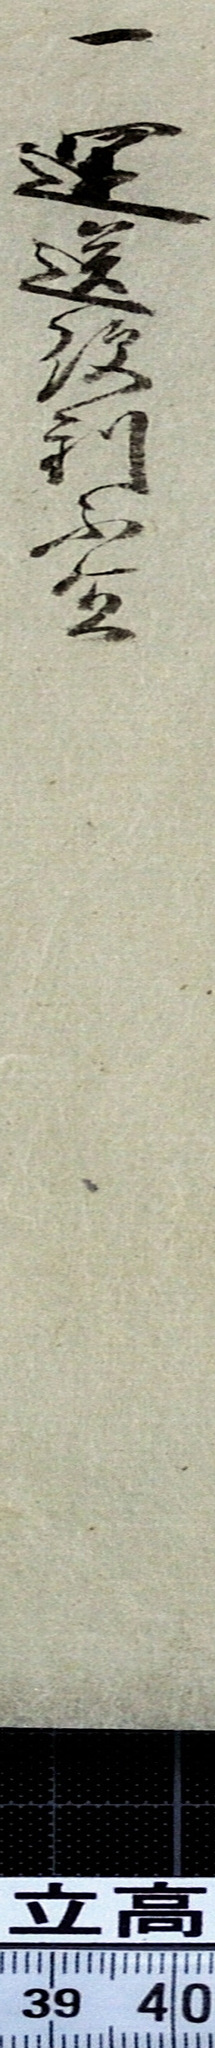一運送便利不宜
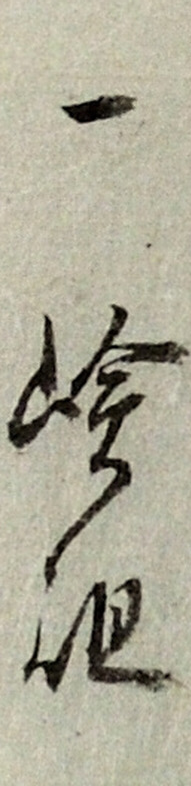一嶮岨

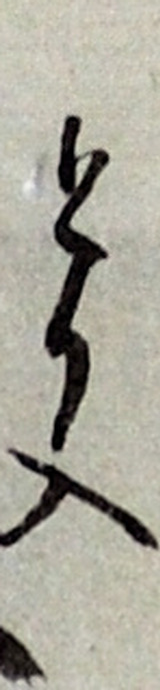とり入
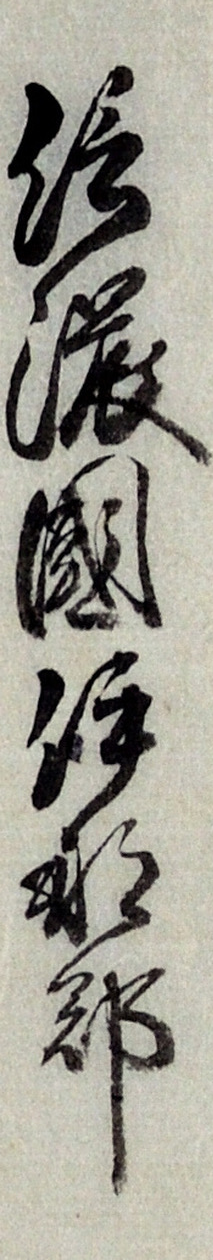信濃国伊那郡
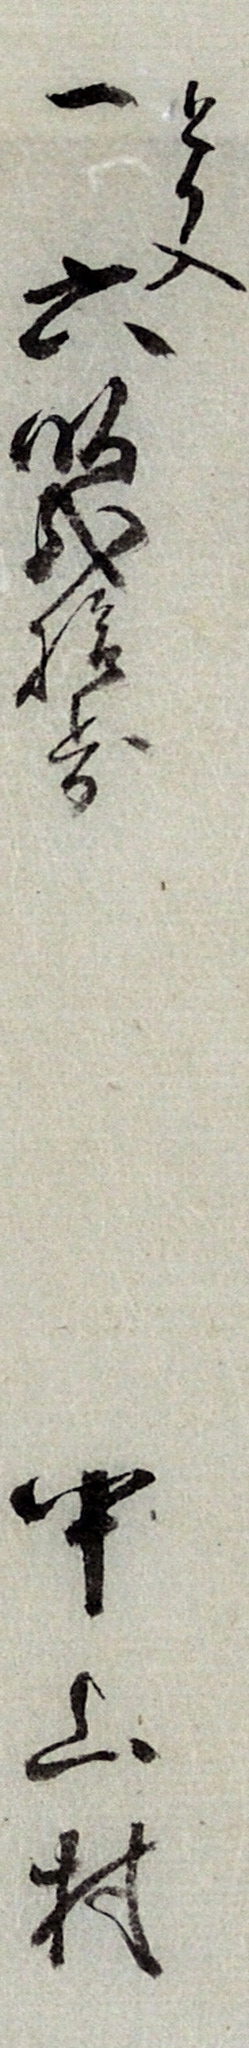一六㽗弐拾歩中山村
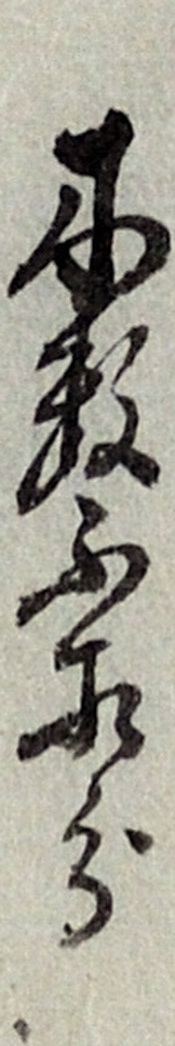木数不相分
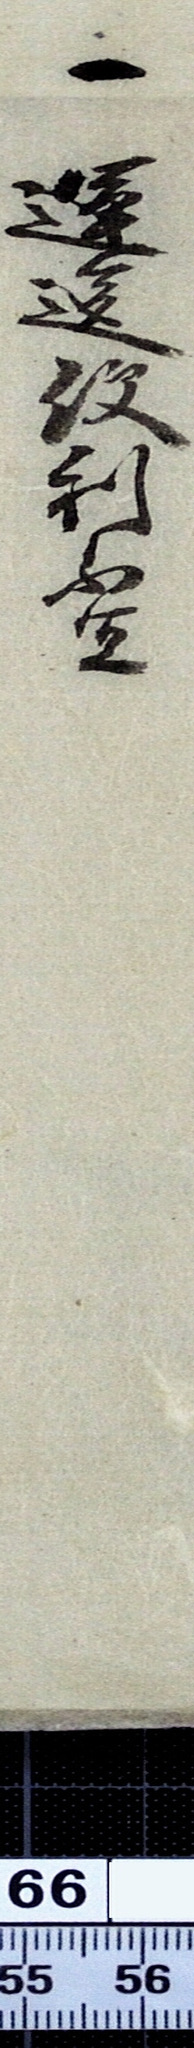一運送便利不宜
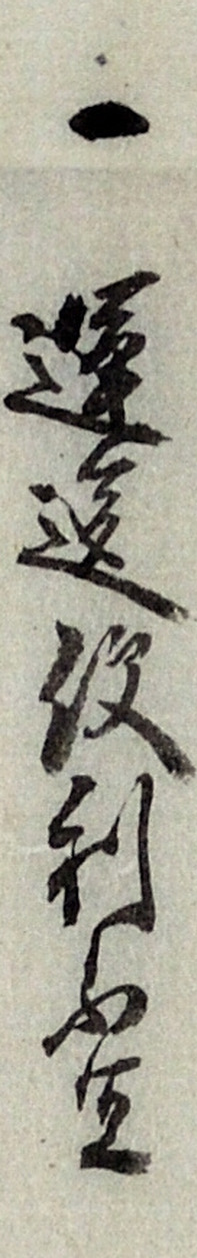一運送便利不宜
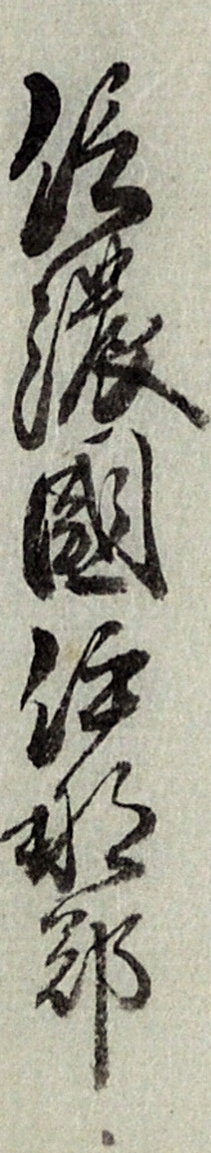信濃国伊那郡
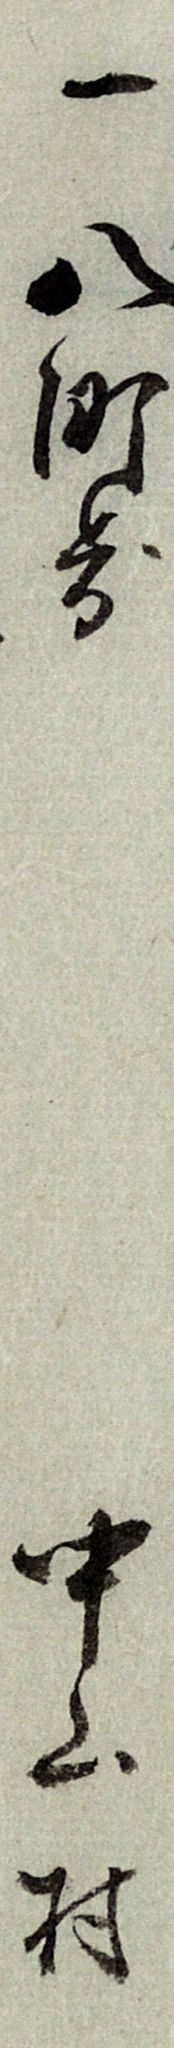一八町歩中山村
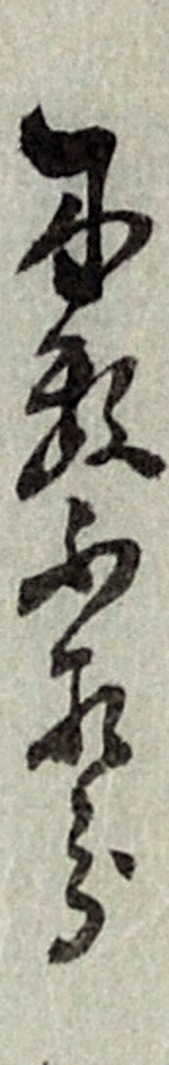木数不相分
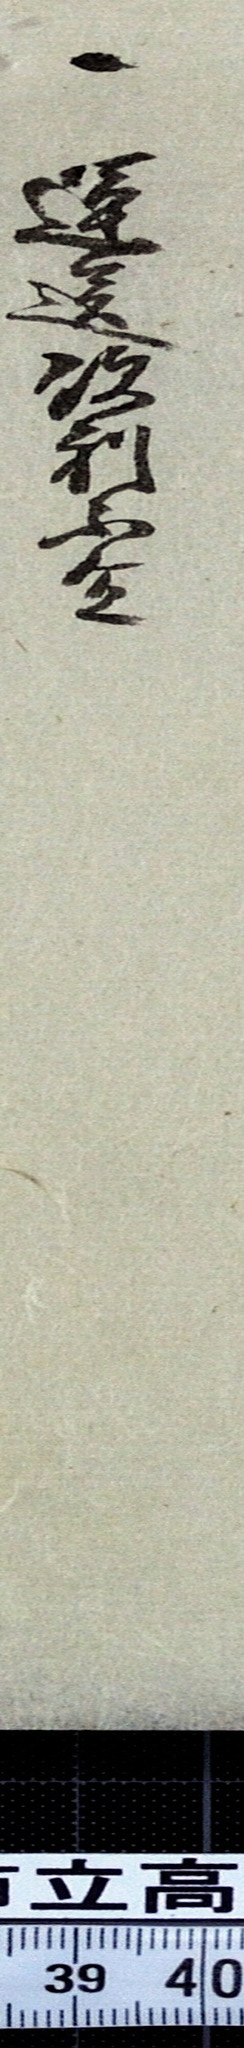一運送便利不宜
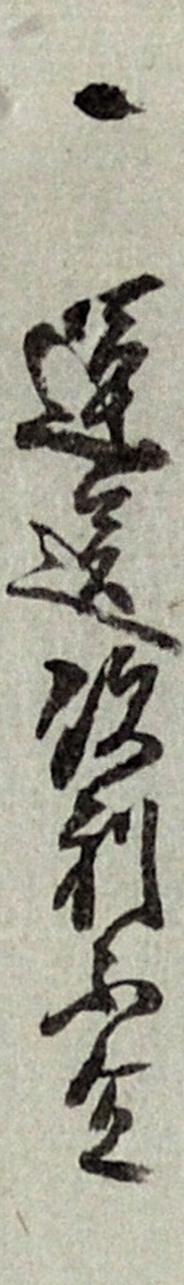一運送便利不宜

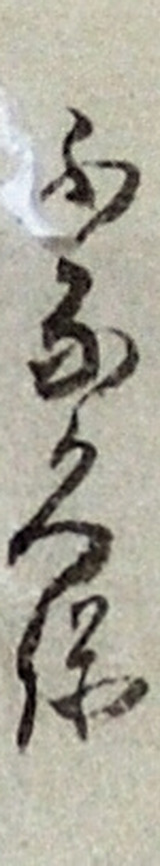ふな久保
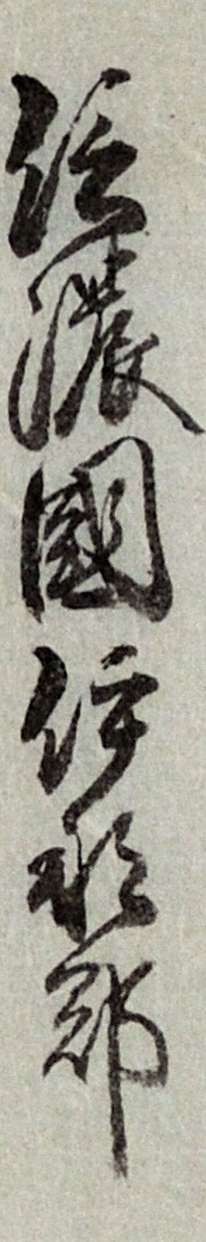信濃国伊那郡
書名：官林反別帳
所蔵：伊那市立高遠町図書館・合同会社AMANE
